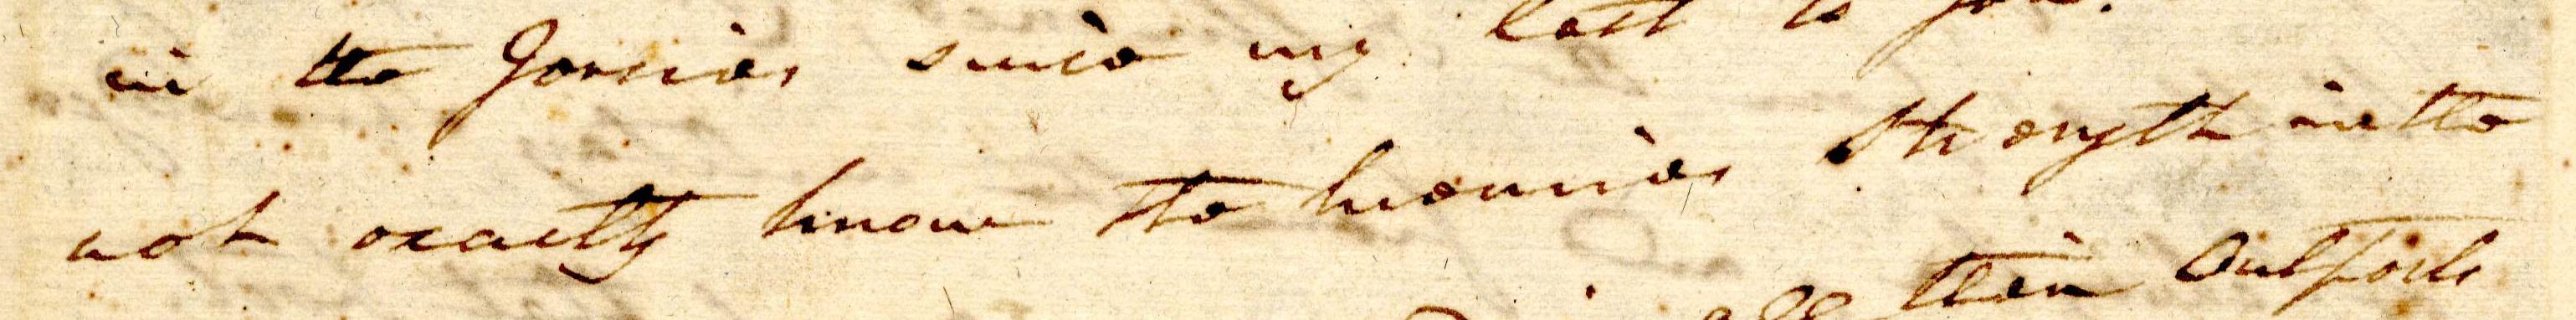not really know the Enemies strength in the
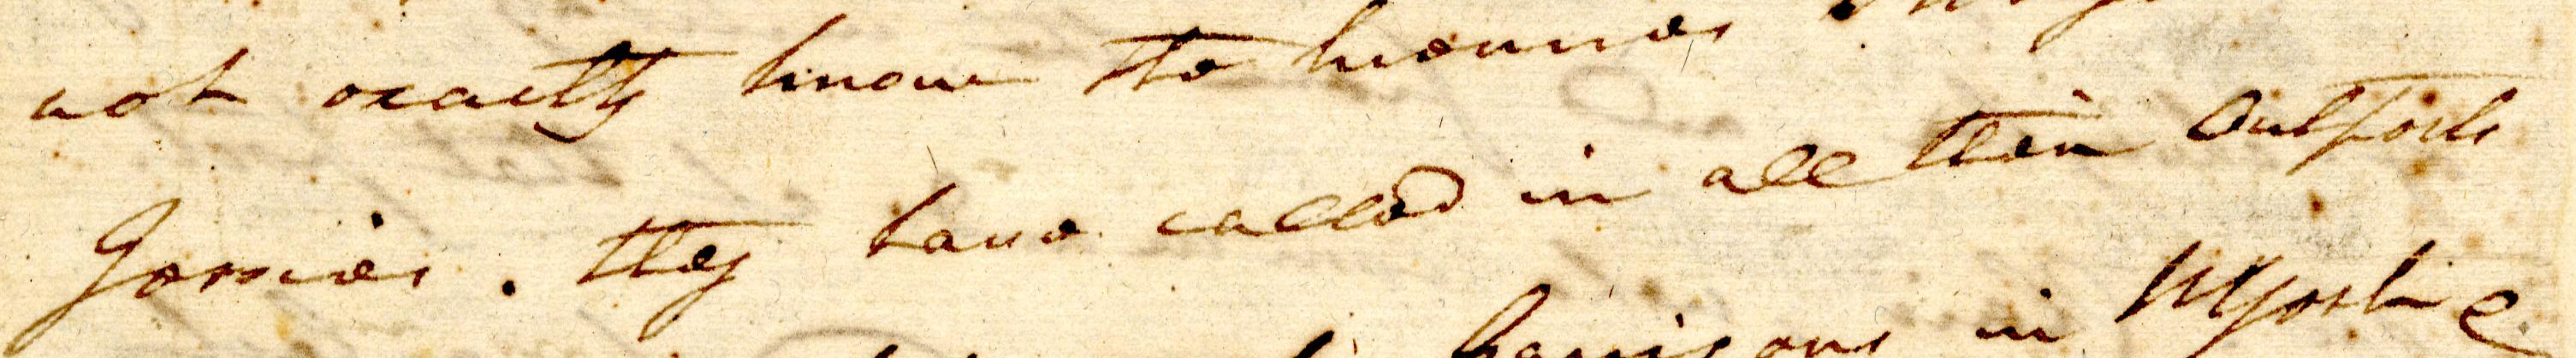Jersies, they have called in all their Outposts
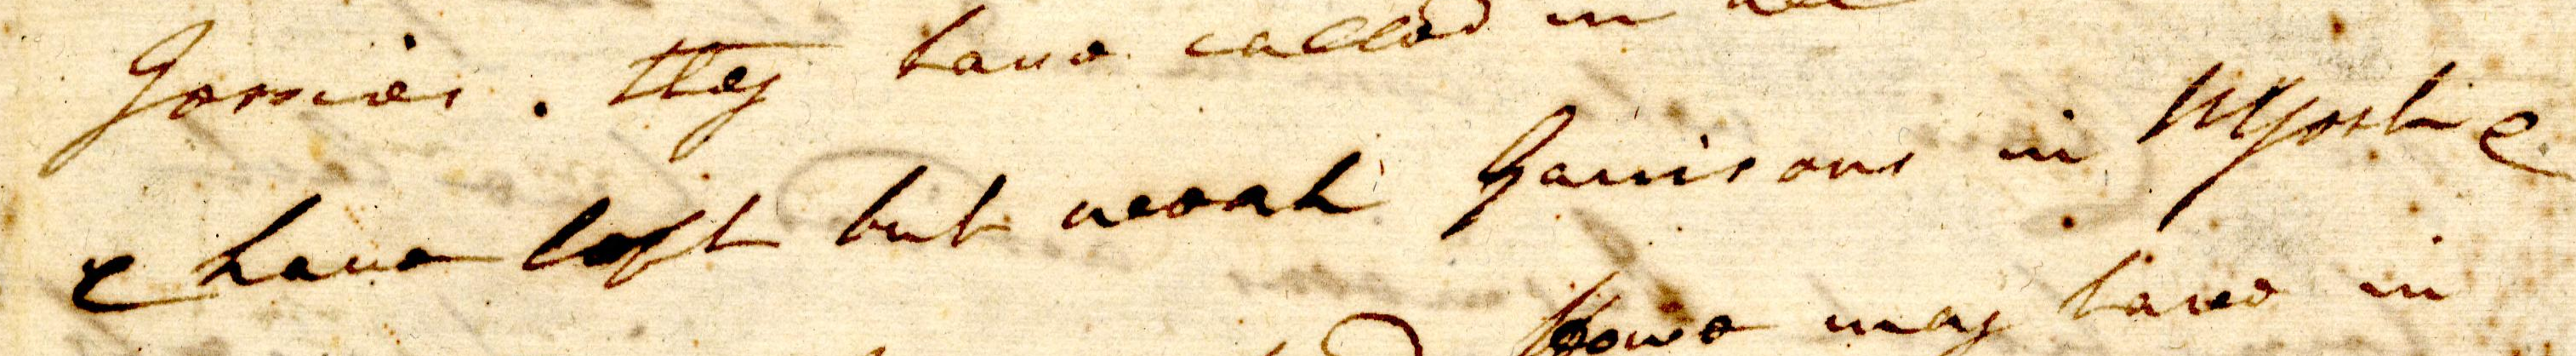& have left but weak Garrisons in N York &
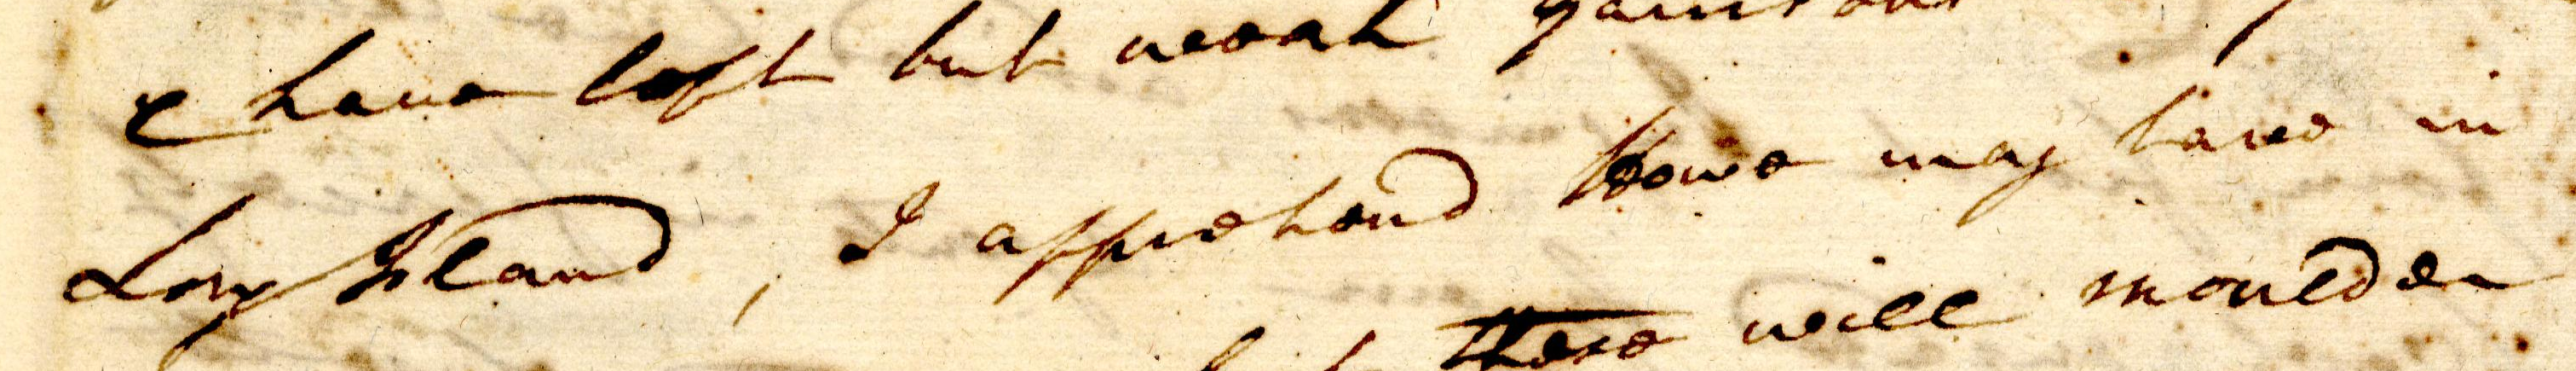Long Island, I apprenhend Howe may have in
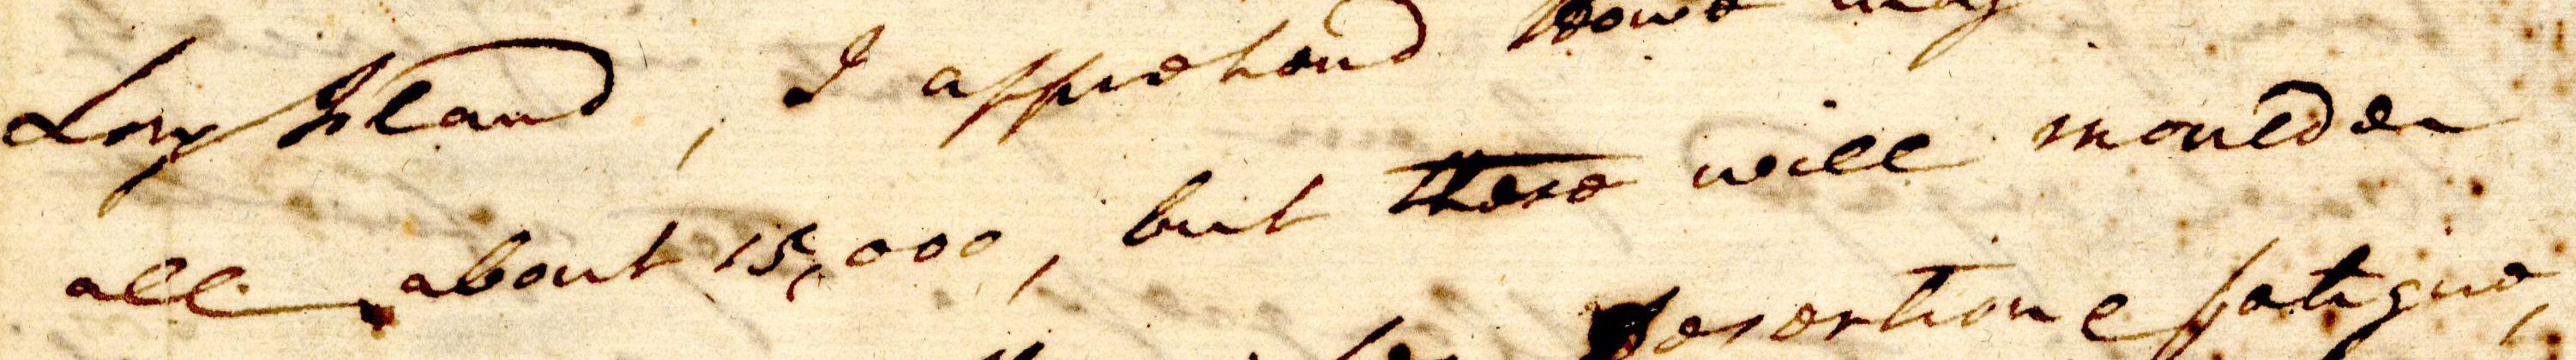all about 15,000 but these will moved
